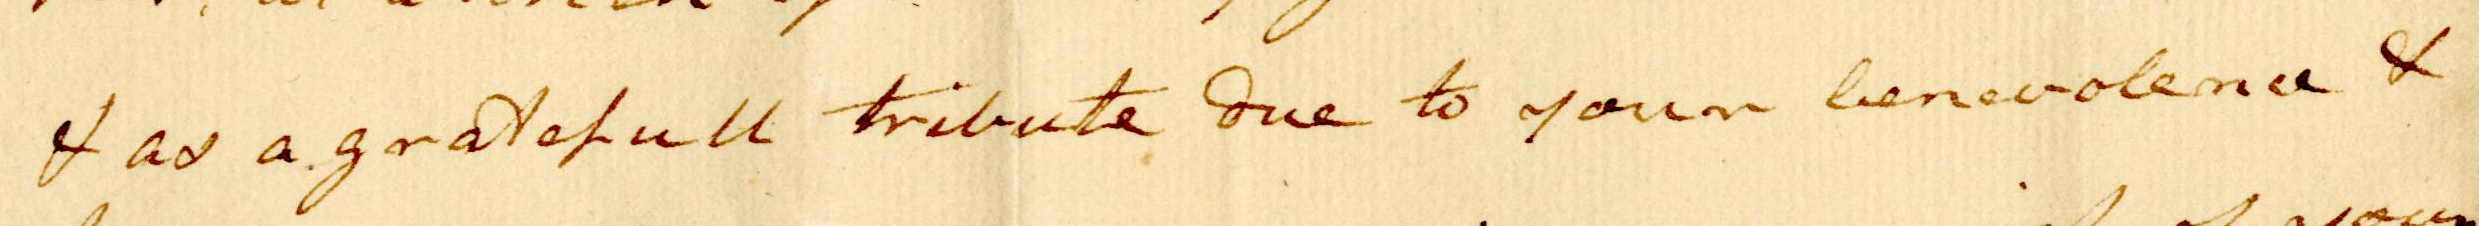& as a gratefull tribute due to your benevolence &
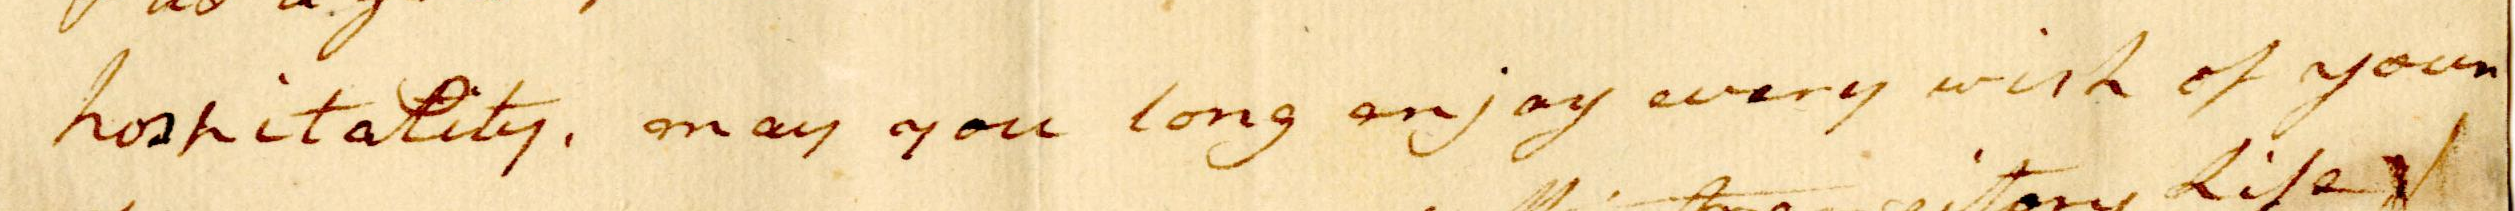hospitality. may you long enjoy every wish of your
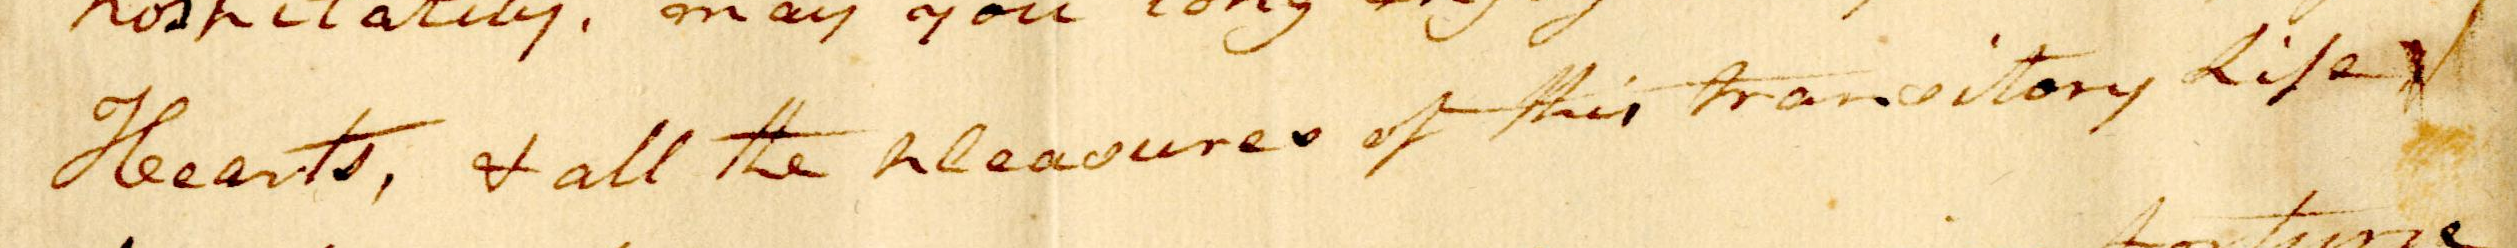Hearts, & all the pleasures of this transitory Life
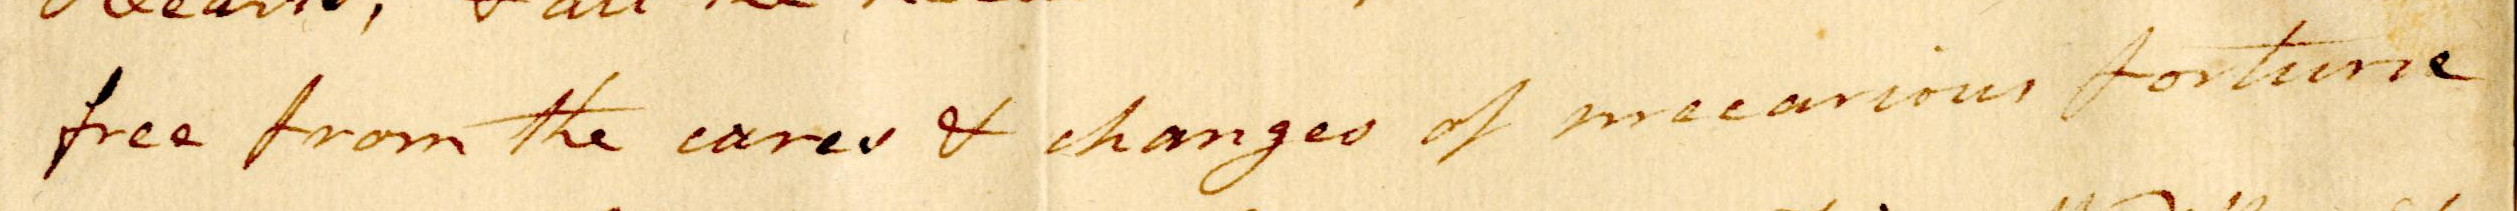free from the cares & changes of precious fortune
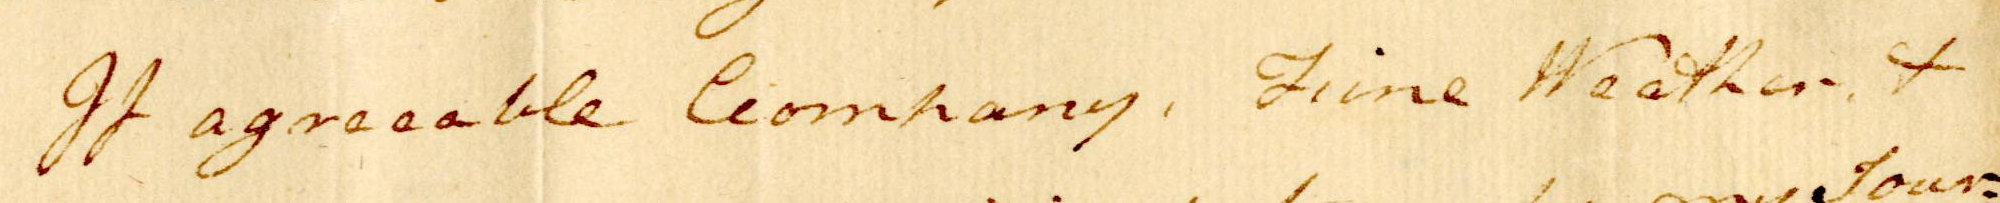If agreeable Company, Fine Weather &
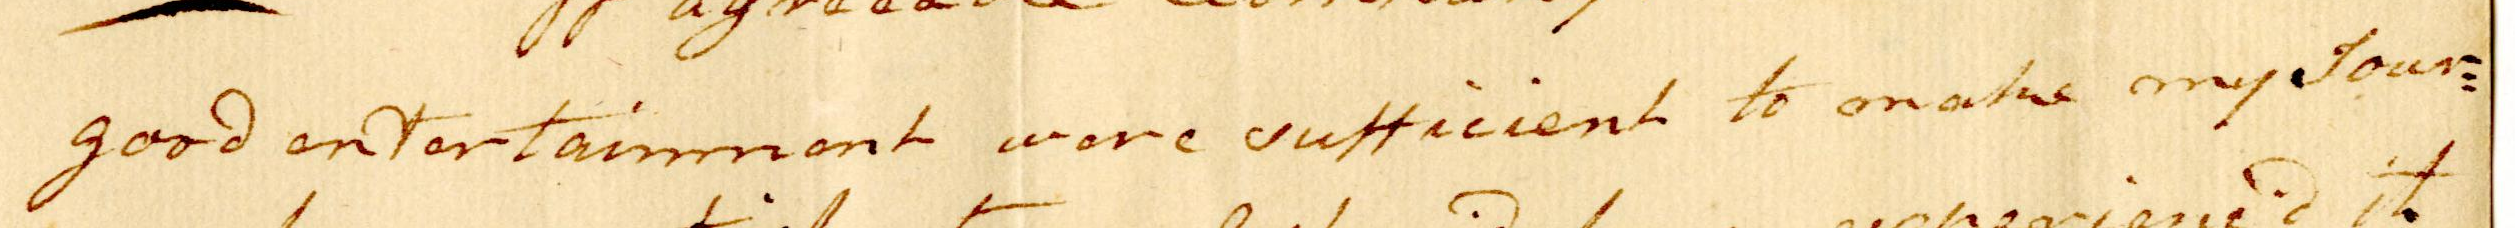good entertainment were sufficient to make my Jour-
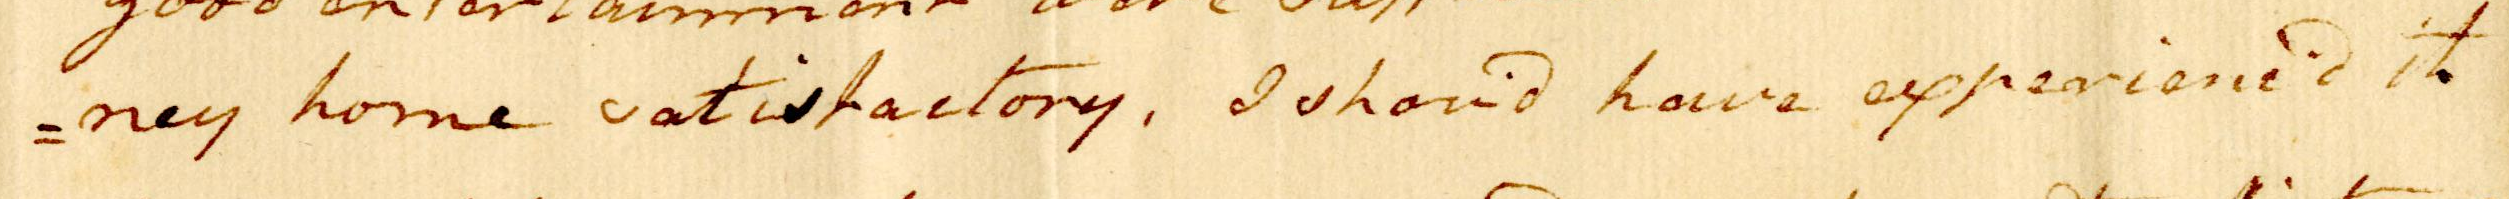-ney home satisfactory. I shou'd have experienc'd it
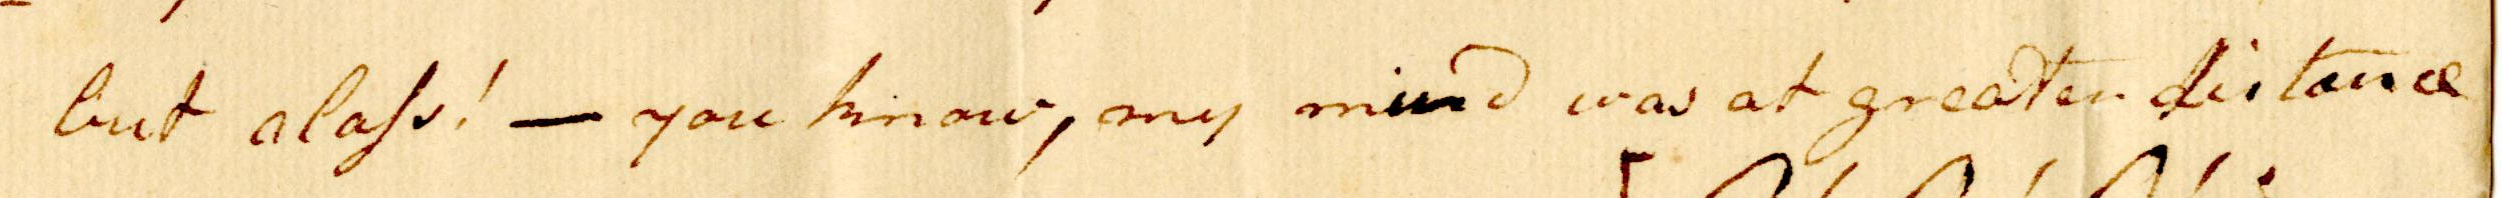but alass!- you know, my mind was at greater distance
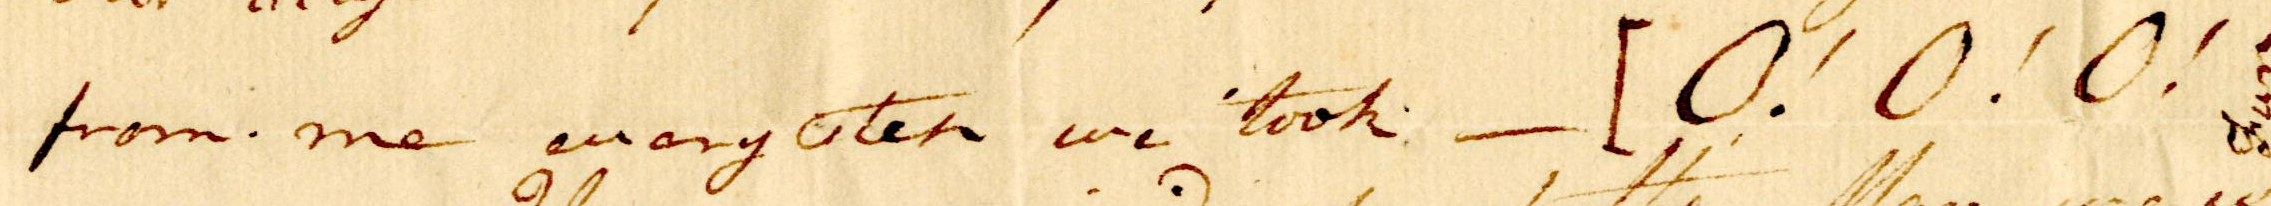from me every step we took.-(O! O! O!
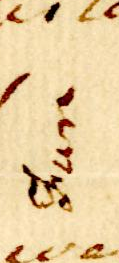Fun
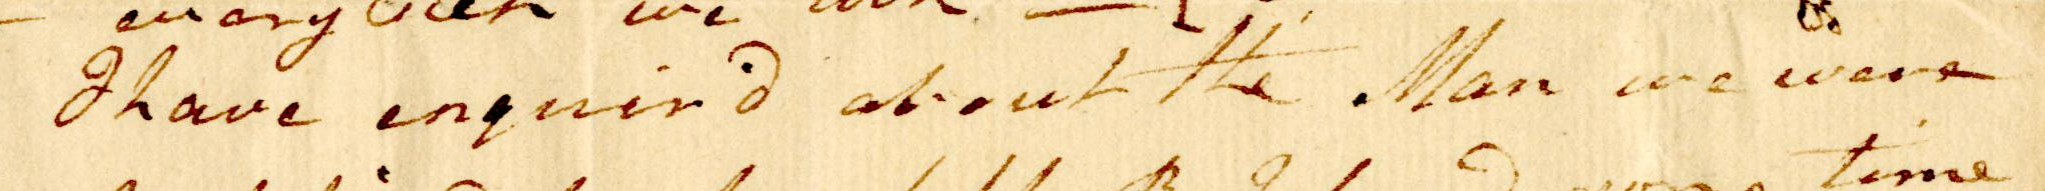I have inquir'd about the Man we were
